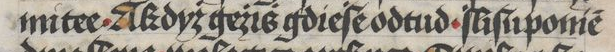mi tee.Akdyż geżiṡ gdieẛe odtud.ẛli ſu poníē
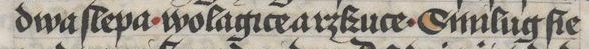dwa ſlepa.wolagice a rzkuce.Smilug ſie
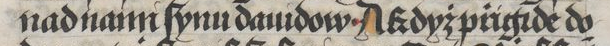nad nami ſynu dauidow.A kdyż pṙígide do
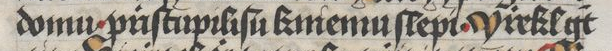domu.pṙiſtupili ſu kniemu ſlepi.Yṙekl ḡt
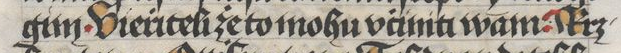gim.Vieṙiteli że to mohu vċiniti wam?Rrz¬
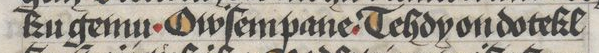ku gemu.Owẛem pane.Tehdy on dotekl
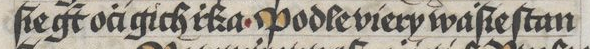ſie ḡt oċí gich ṙka.Podle víery waẛe ſtan¬
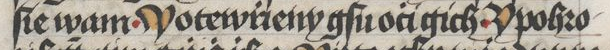ſie wam.Yotewṙieny gſu oċi gích.Ypohro¬
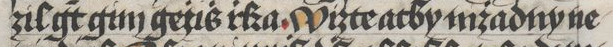zil ḡt gim geżiṡ ṙka.Vizte atby niżadny ne¬
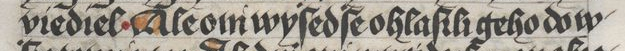viediel.Ale oni wyẛedẛe ohlaſili geho do w¬
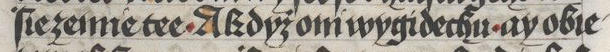ẛie zemie tee.Akdyż oni vygidechu.ay obie¬
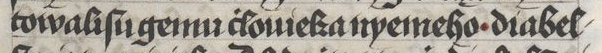towaliſu gemu ċlouieka nyemeho.diabel¬
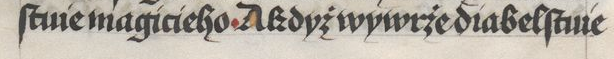ſtuie magícíeho.Akdyż wywrże díabeſtuíe
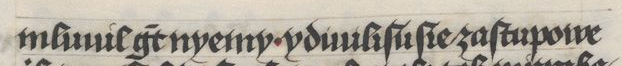mluuil ḡt nyemy.ydiuili ſu ſie zaſtupowe
